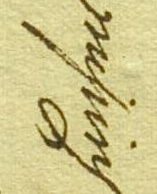missing
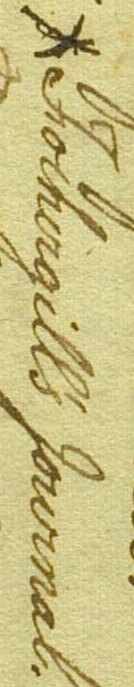* Fothergill's Journal.
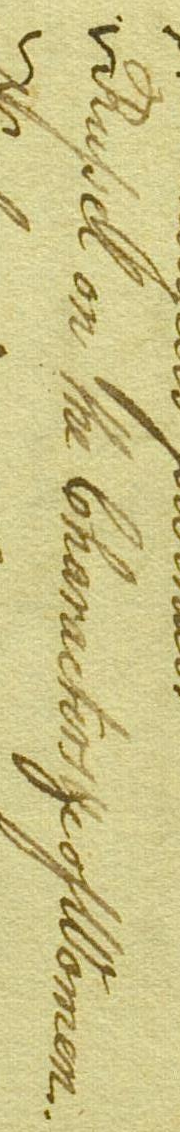- Russel on the Characters of Women.
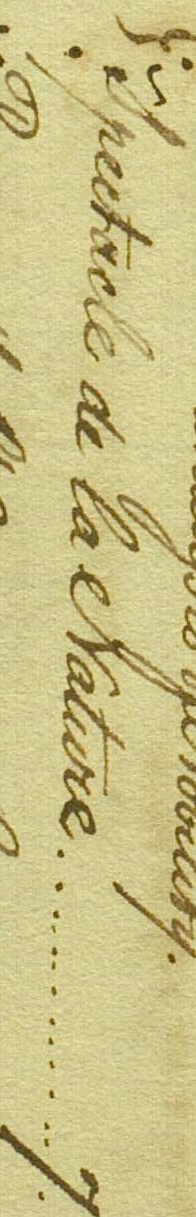- Spectacle de la Nature..........7.
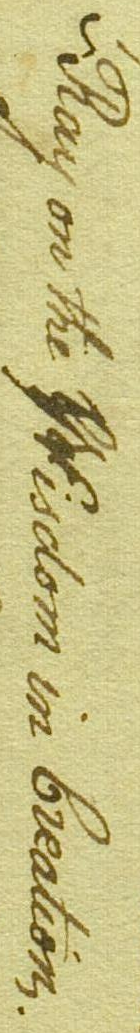- Ray on the Wisdom in Creation.
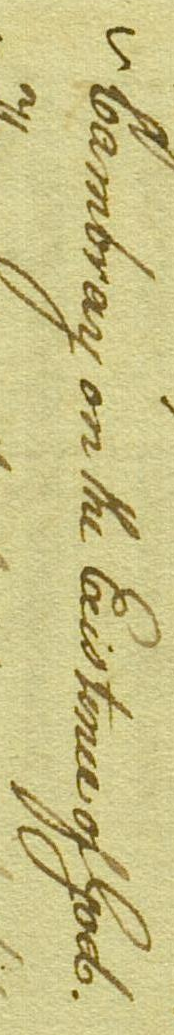- Cambray on the Existence of God.
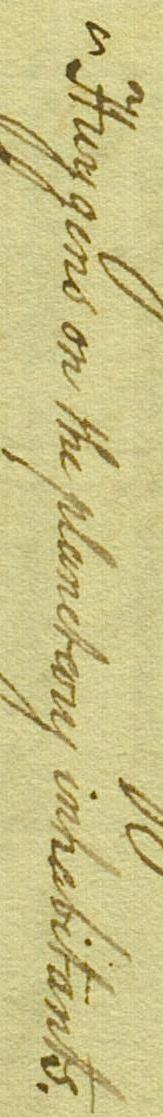- Huygens on the planetary inhabitants.
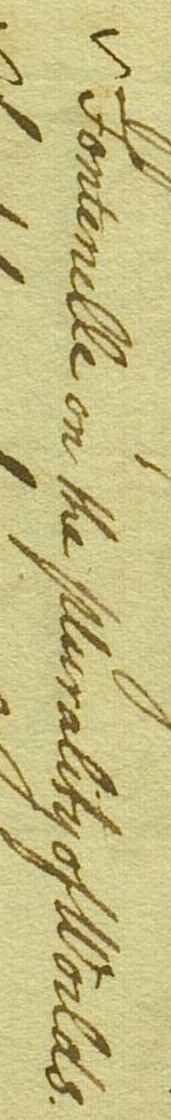- Fontenelle on the plurality of Worlds.
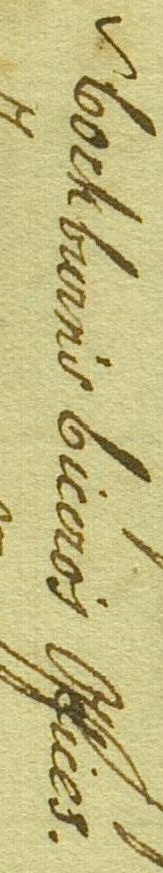- Cockburn's Cicero's Offices.
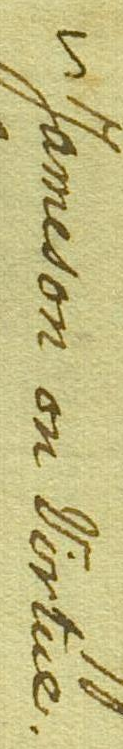- Jameson on Virtue.
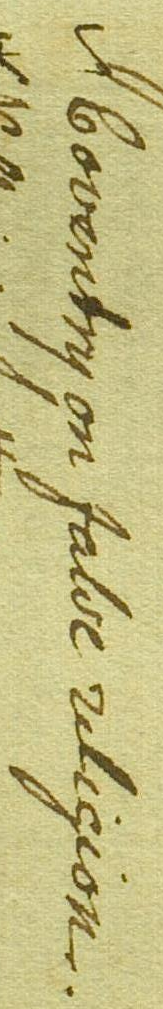- Coventry on false religion.
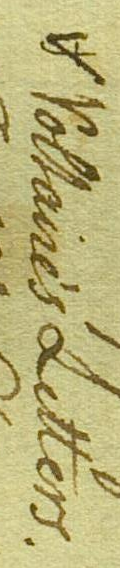- Voltaire's Letters.
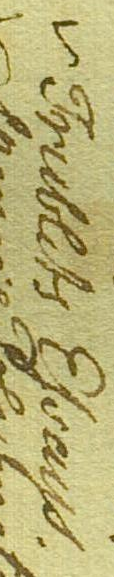- Trublets Essays.
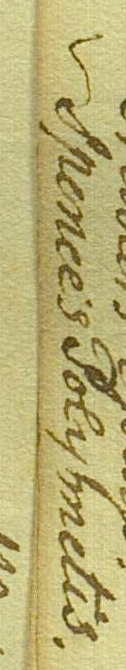- Spence's Polymetis.
